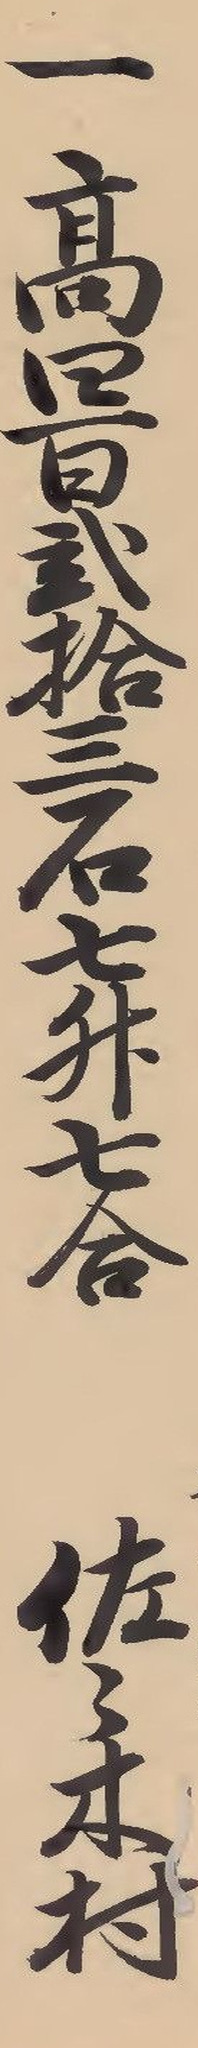一高四百弐拾三石七升七合佐々木村
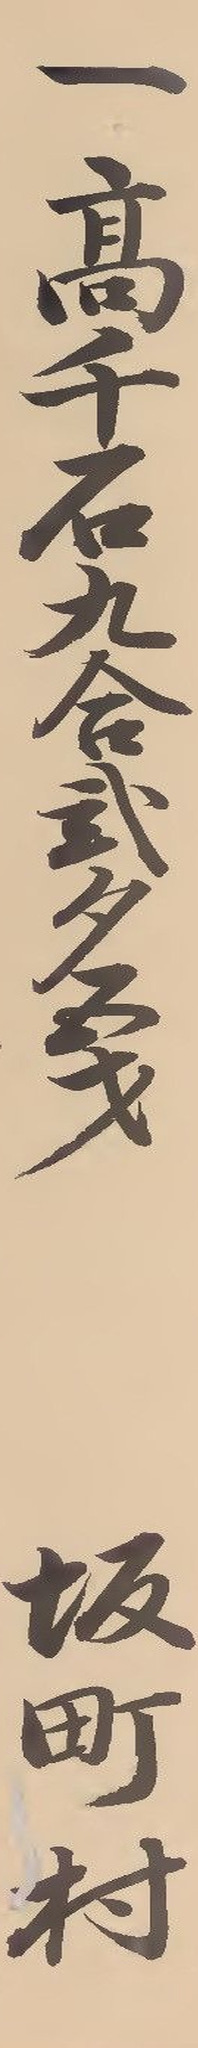一高千石九合弐勺五才坂町村
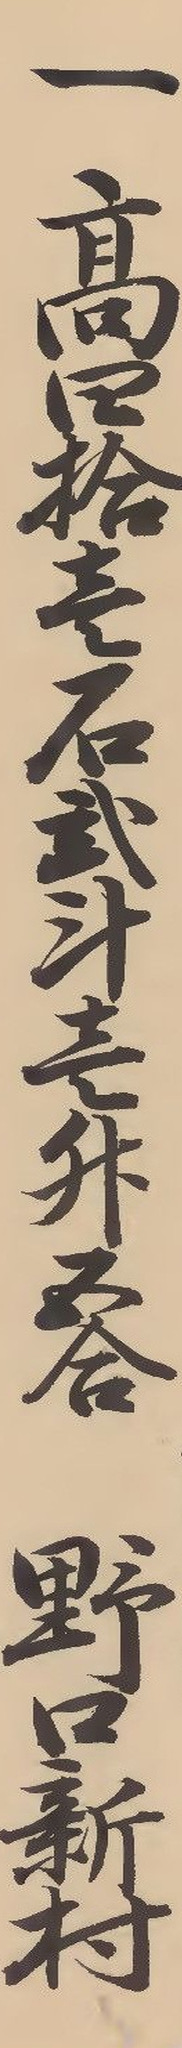一高四拾壱石弐斗壱升五合野口新村
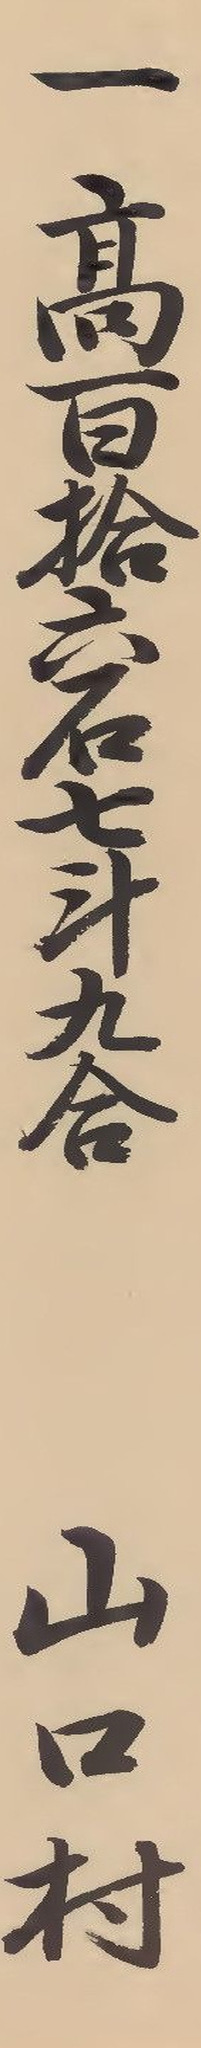一高百拾六石七斗九合山口村
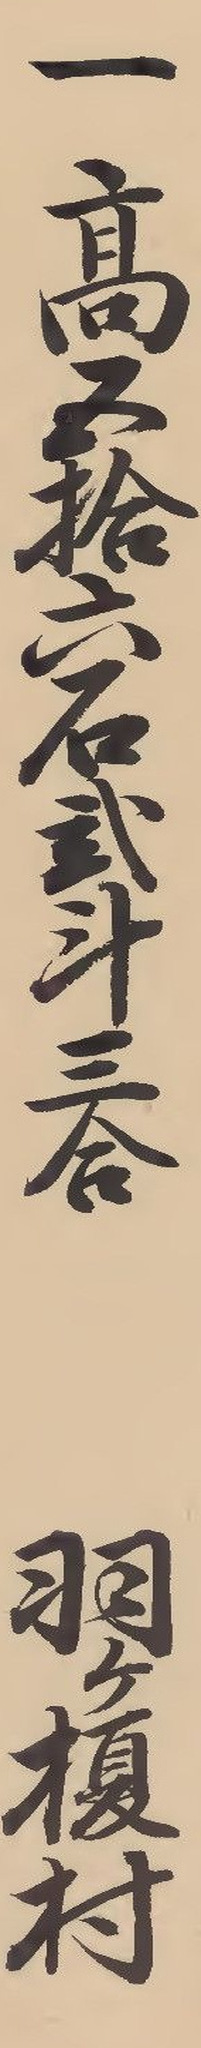一高五拾六石弐斗三合羽ヶ榎村

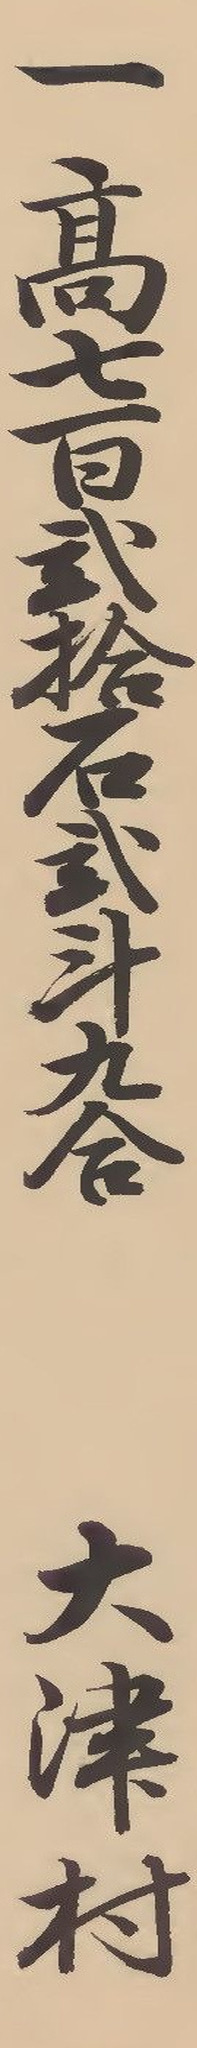一高七百弐拾石弐斗九合大津村
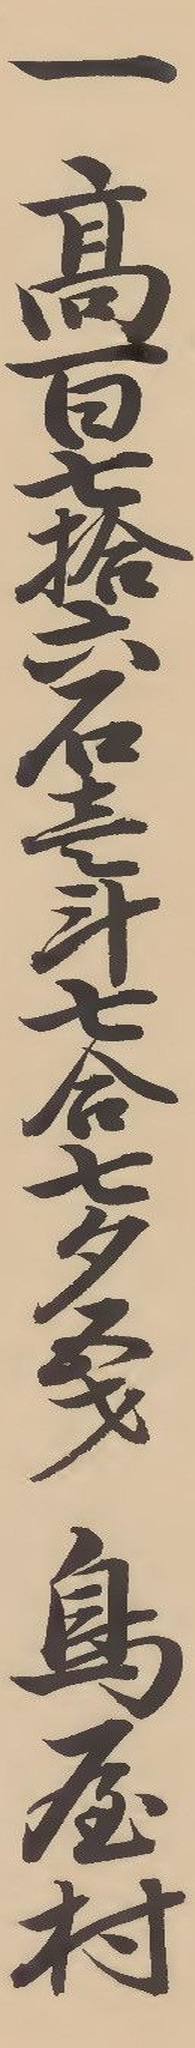一高百七拾六石壱斗七合七勺五才鳥屋村
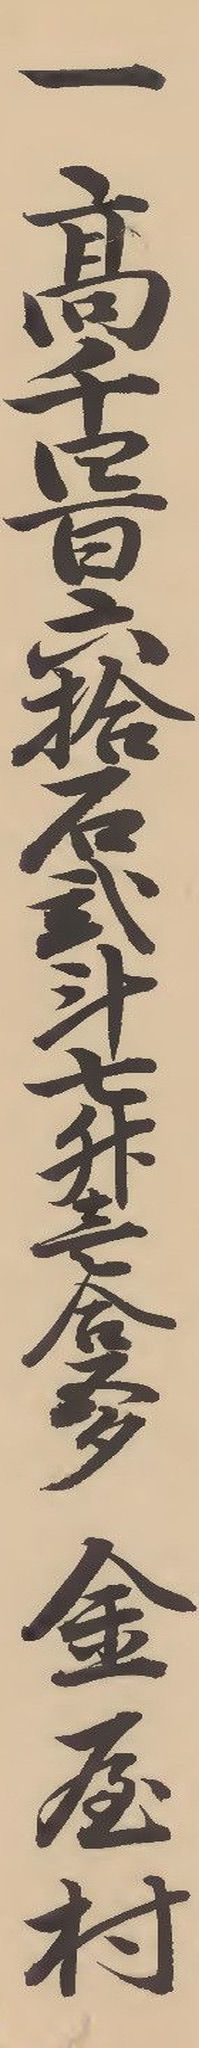一高千四百六拾石弐斗七升壱合五勺金屋村
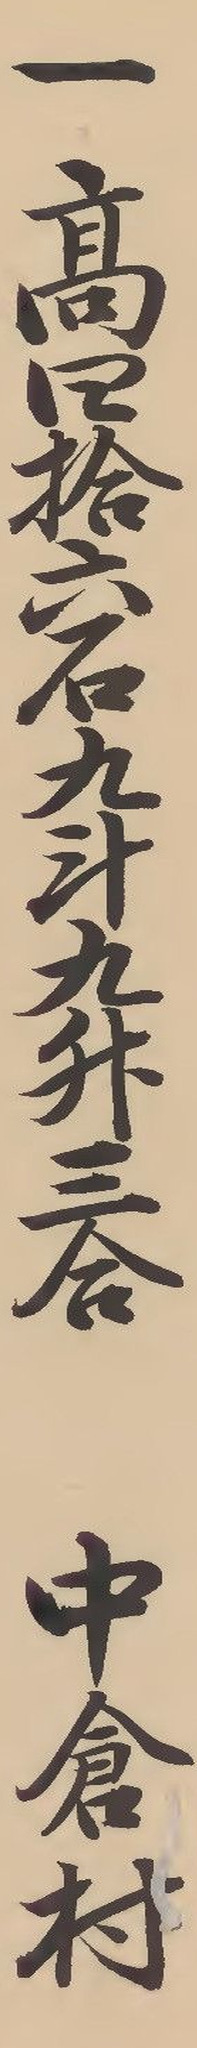一高四拾六石九斗九升三合中倉村
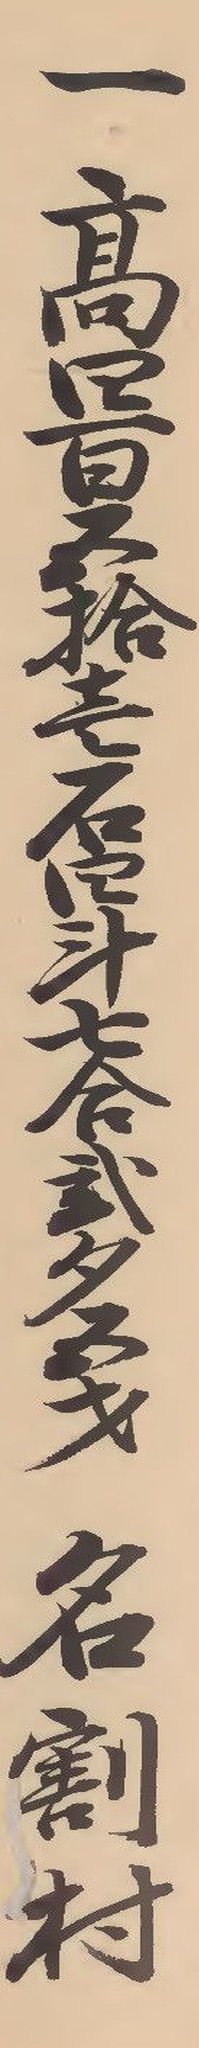一高四百五拾壱石四斗七合弐勺五才名割村
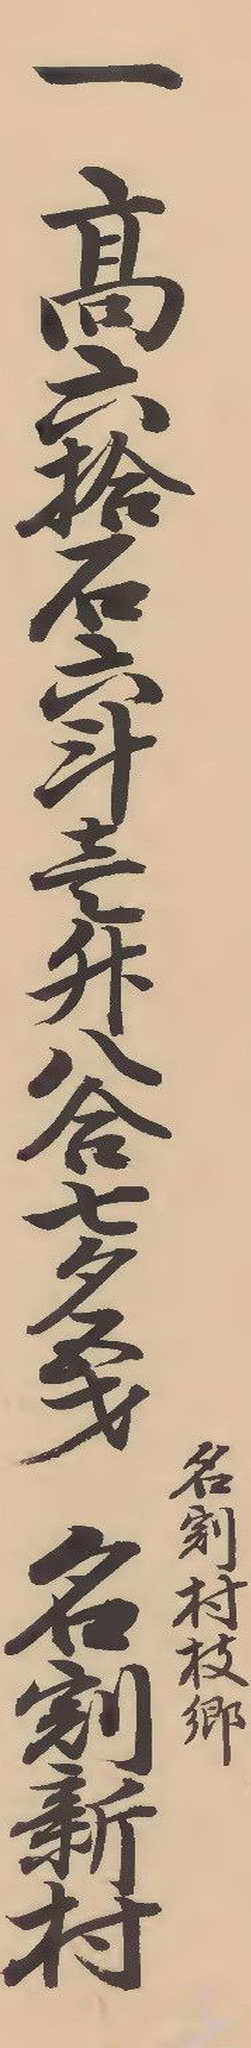一高六拾石六斗壱升八合七勺五才名割新村
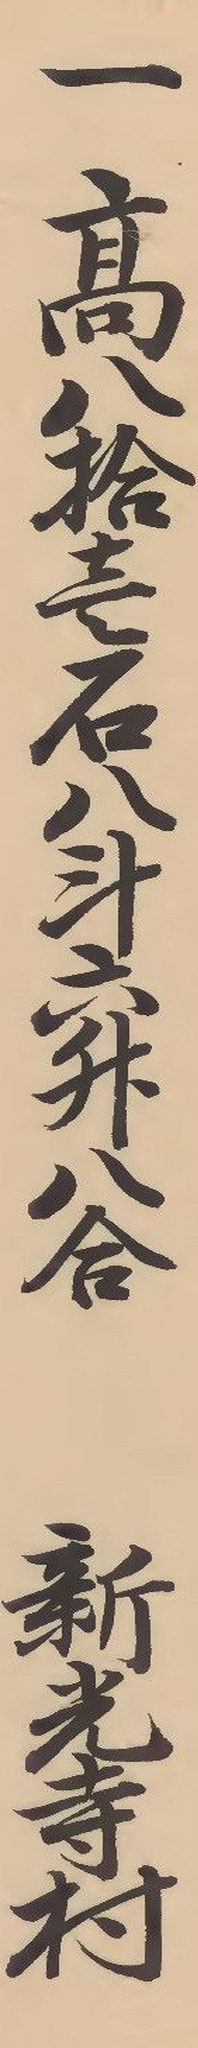一高八拾壱石八斗六升八合新光寺村
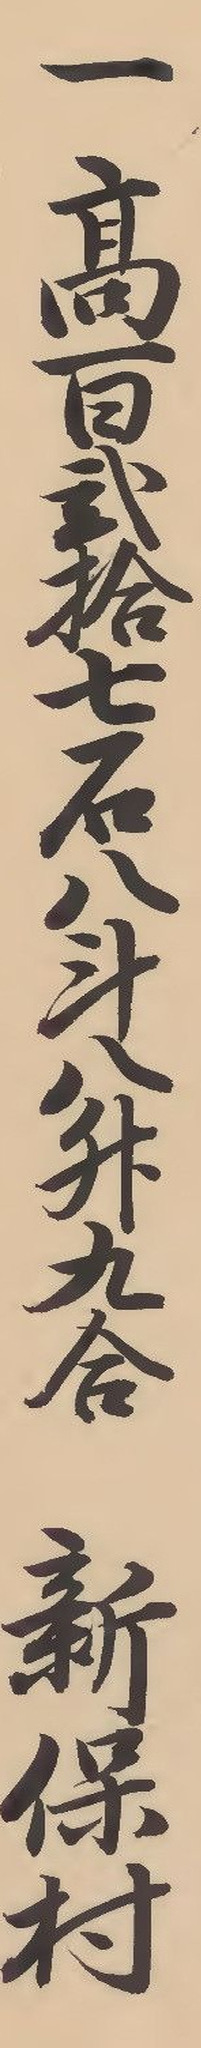一高百弐拾七石八斗八升九合新保村

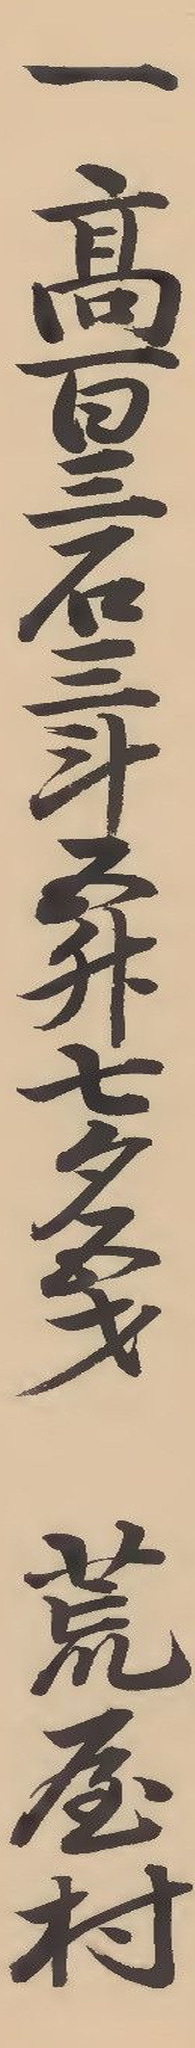一高百三石三斗五升七勺五才荒屋村
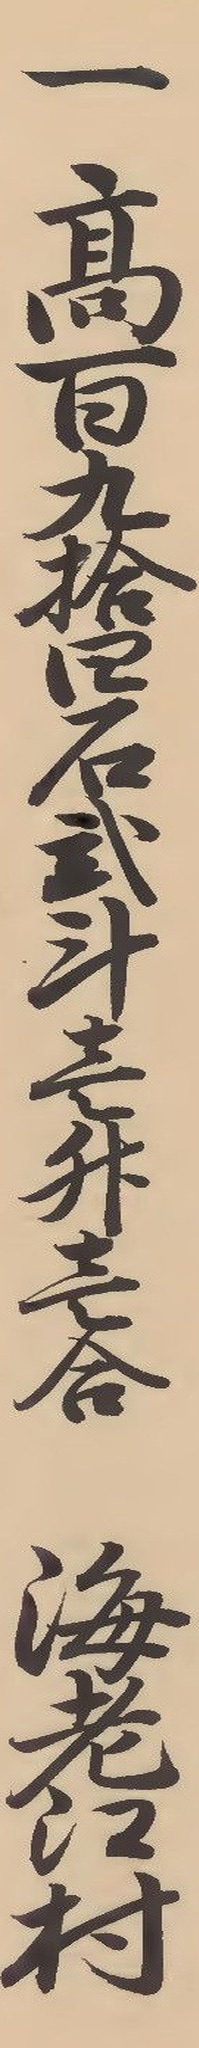一高百九拾四石弐斗壱升壱合海老江村
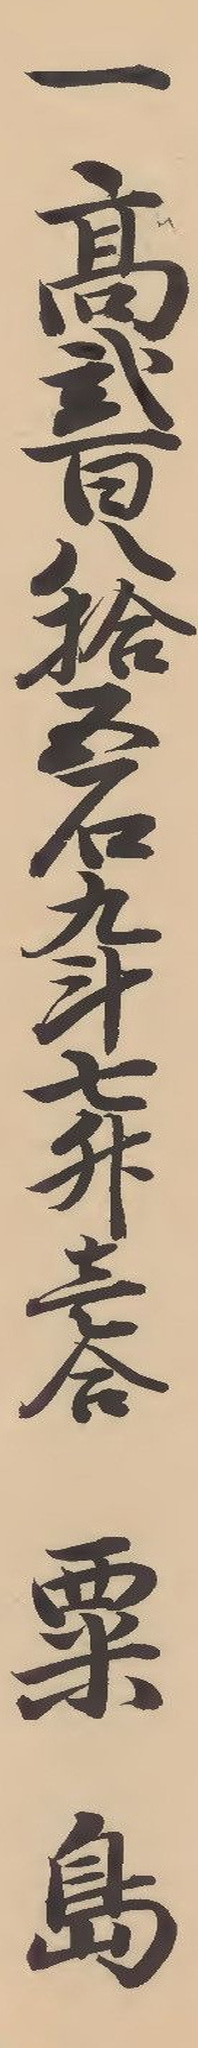一高弐百八拾五石九斗七升壱合粟島
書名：越後国郷帳　下
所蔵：国立公文書館 National Archives of Japan
